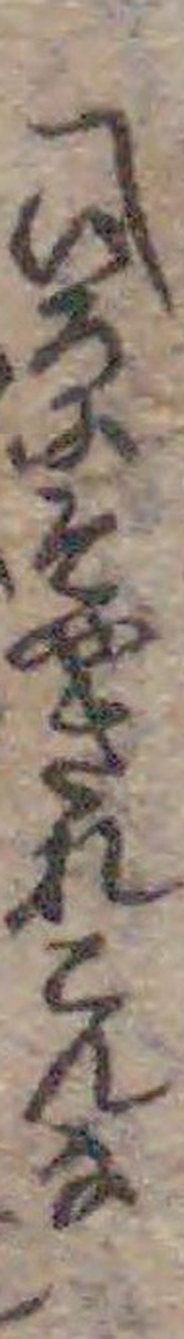〽いろにそやされこんな
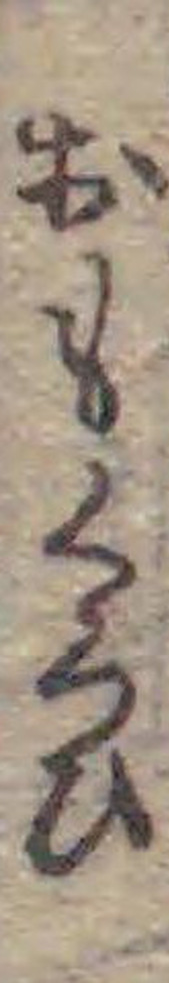おもくろひ
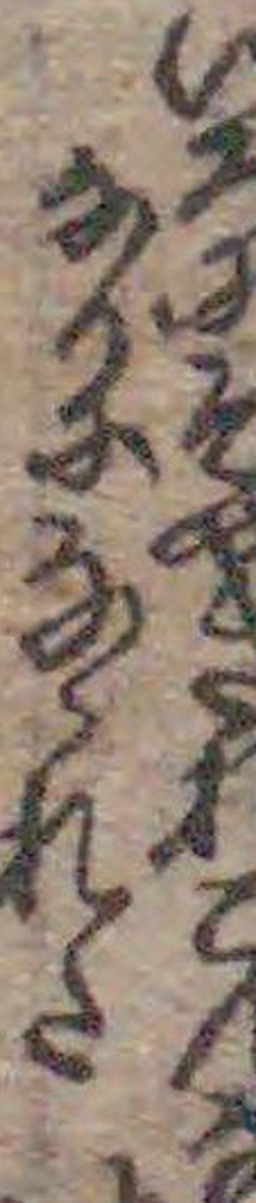なりになられた
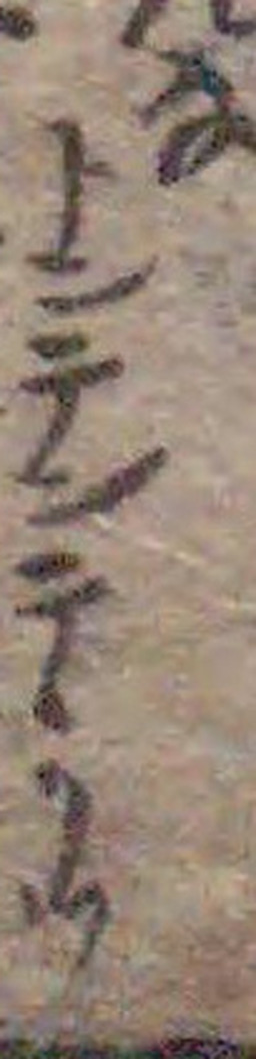トンテンテヽツ

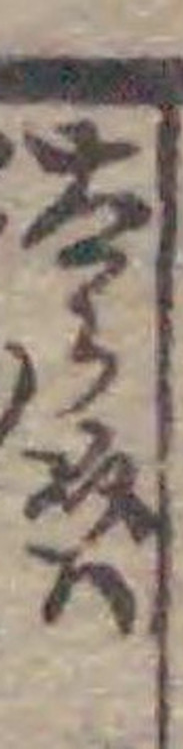太郎介は
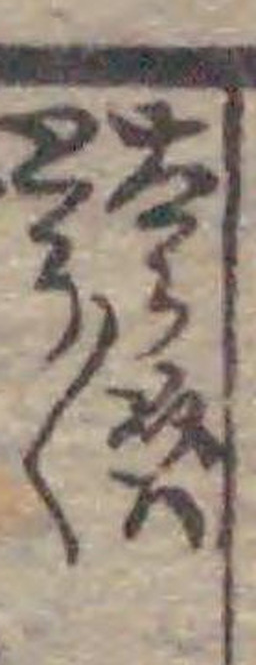とう〳〵
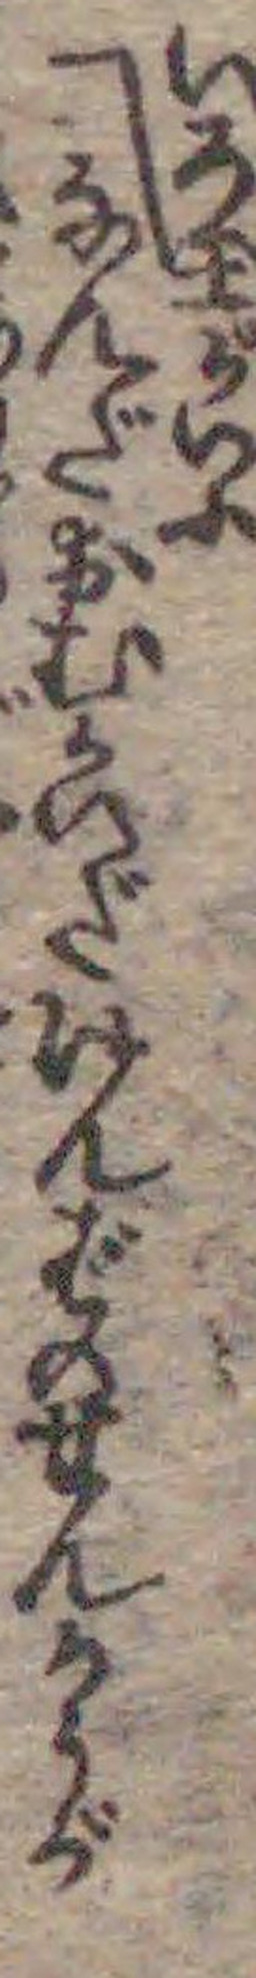〽なんだおむかいだけんばのせんかうが
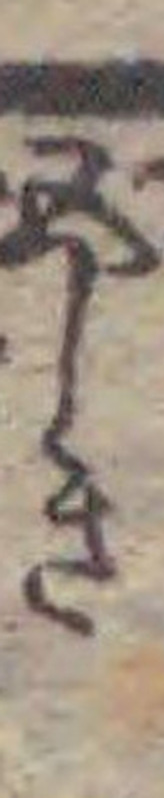五しき
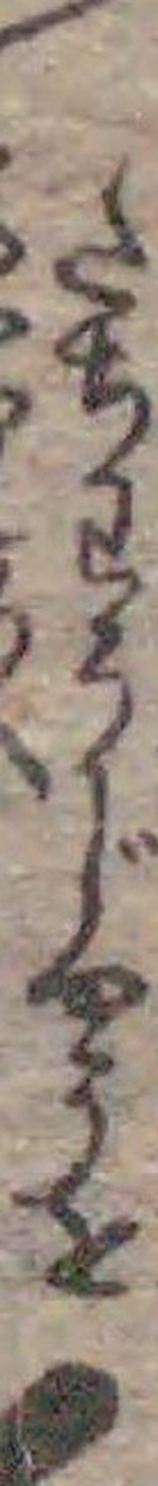たちわうじやうを
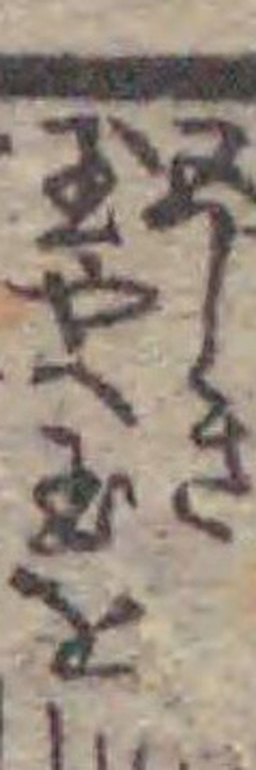玉やへ玉を
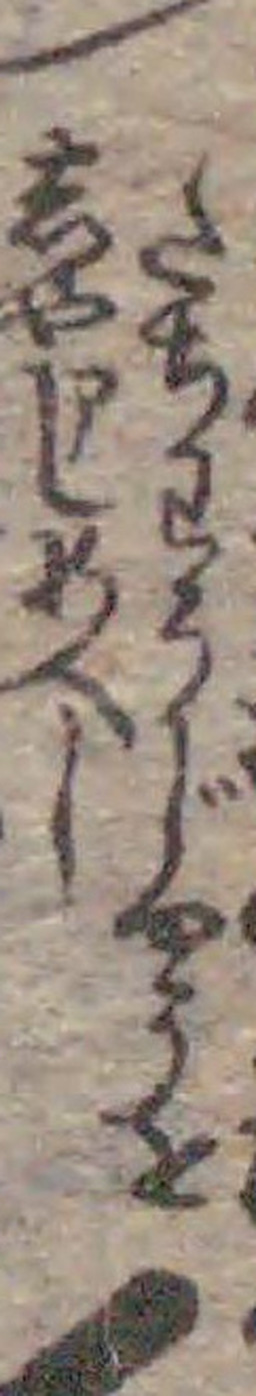しやァしめへし
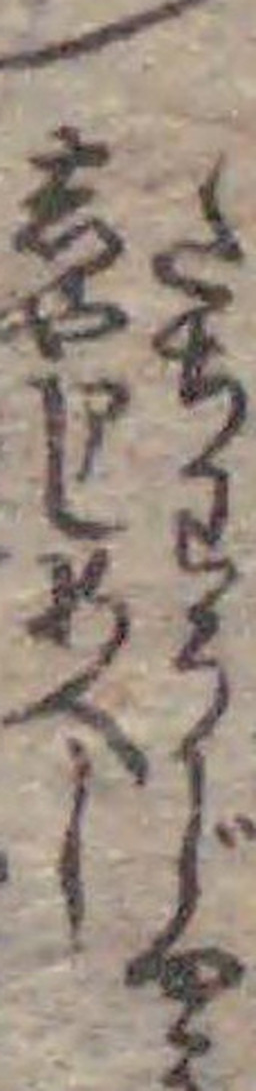しやァしめへし
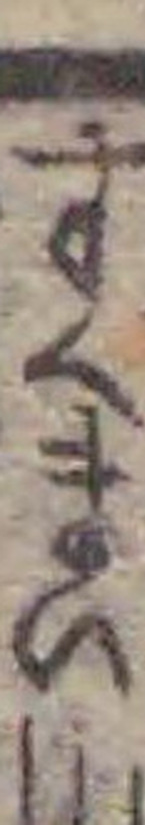すへまい
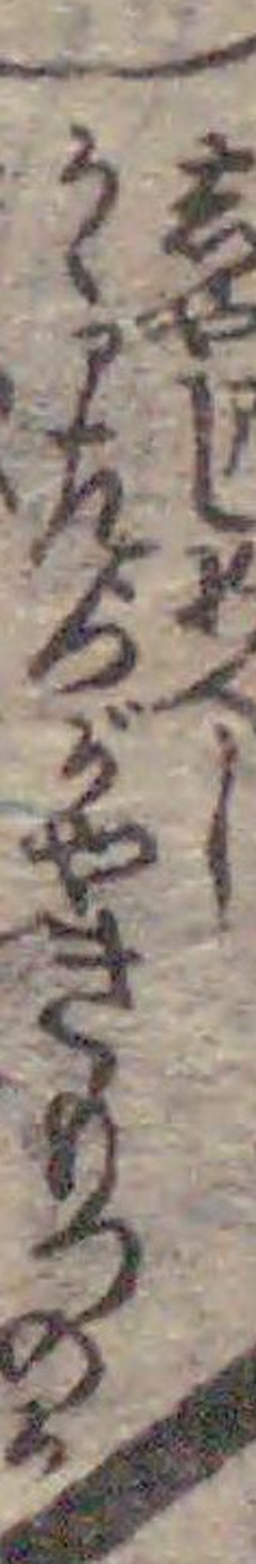かゝァたちがやきもつのか
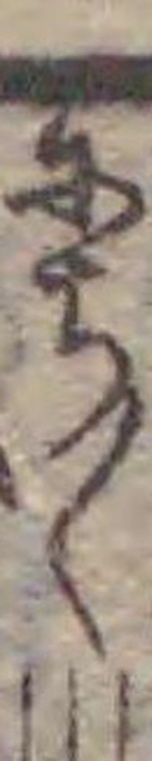にち〳〵
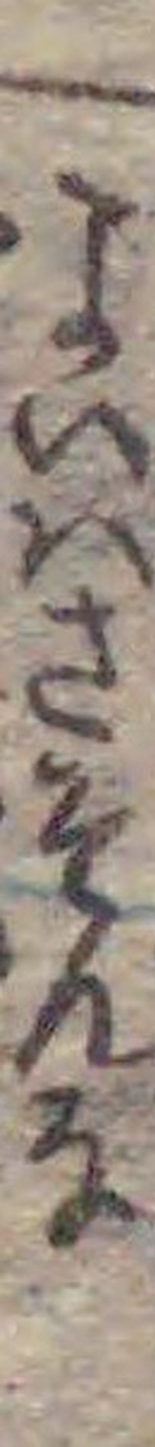よいはさそんな
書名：四遍搨心学草帋 : 3巻
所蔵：国立国会図書館 National Diet Library, JAPAN
